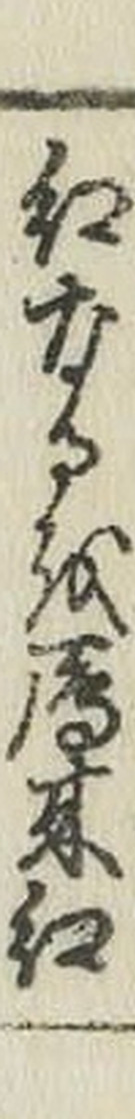紅なるを雁来紅
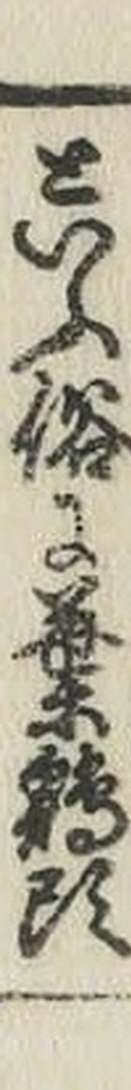といふ俗に葉鶏頭
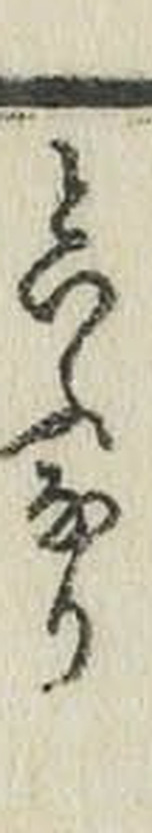といふなり
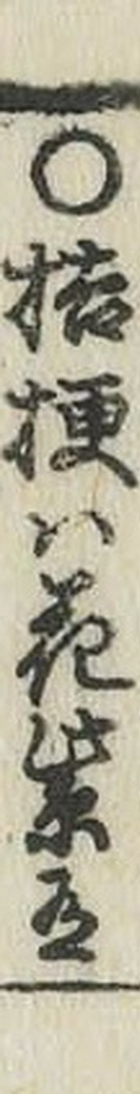○桔梗は花紫有
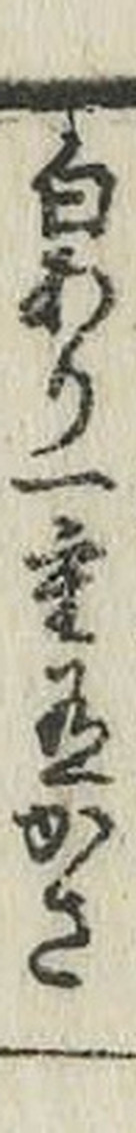白あり一重有かさ
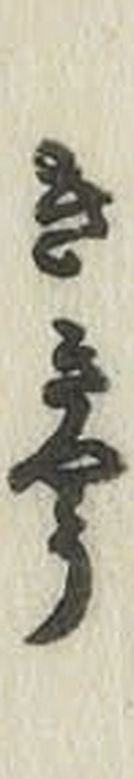ききやう
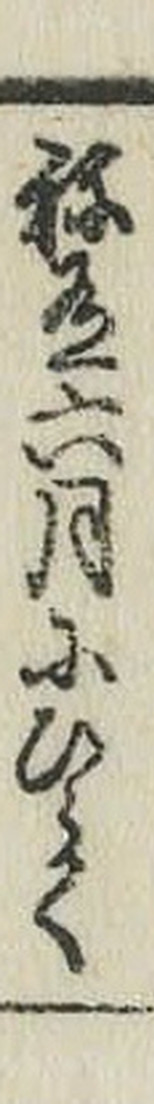ね有六月にひらく
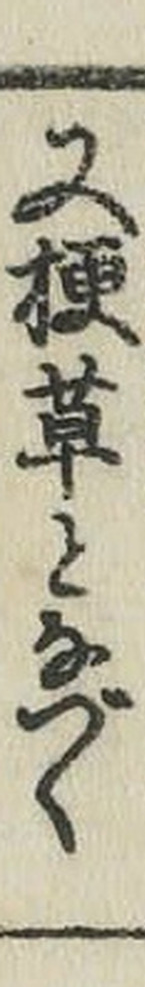又梗草となづく

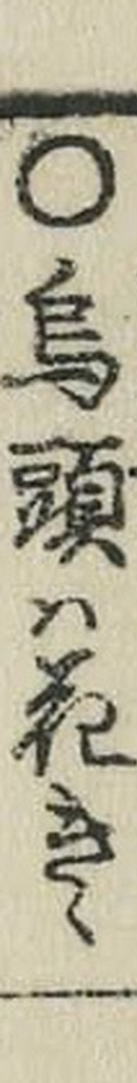○烏頭は花きゝ
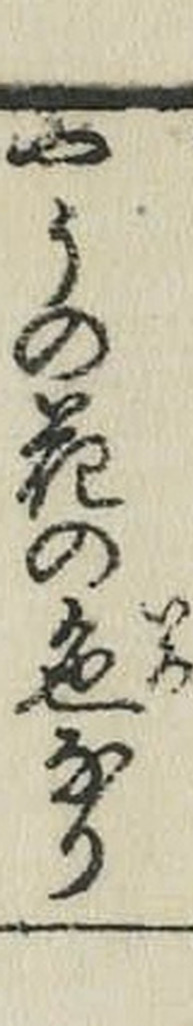やうの花の色なり
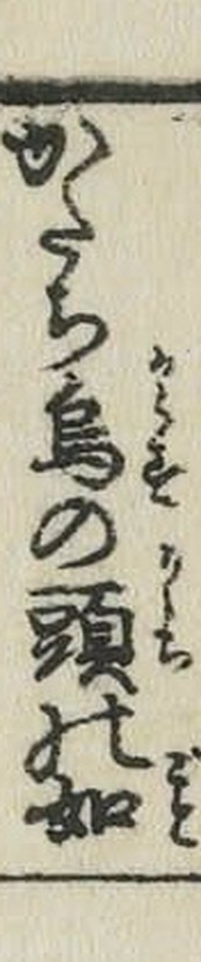かたち烏の頭の如
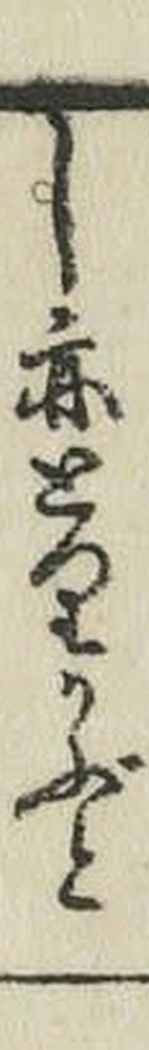し亦とりかぶと
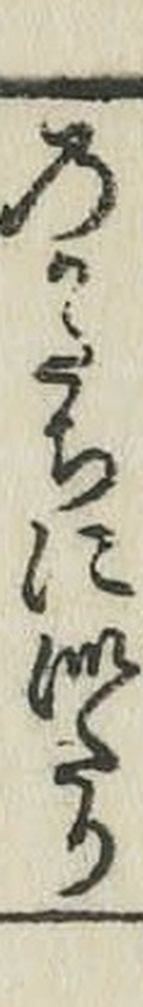のかたちに似たり
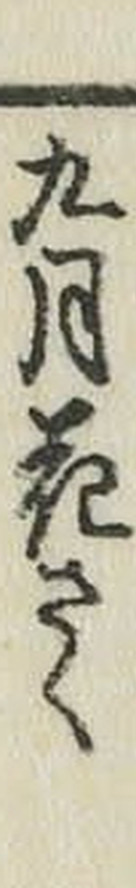九月花さく
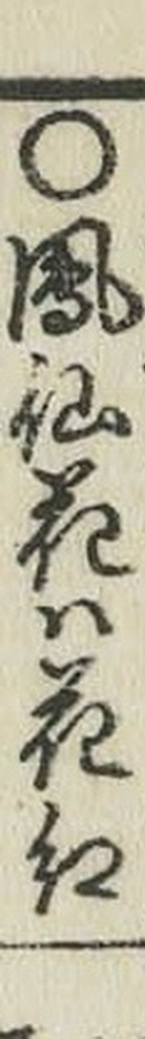○鳳仙花は花紅
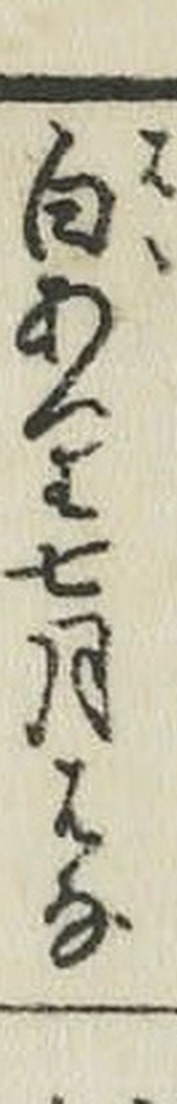白あり七月はな
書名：増補頭書訓蒙図彙大成 10巻 9:巻之20
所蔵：東京学芸大学教育コンテンツアーカイブ
